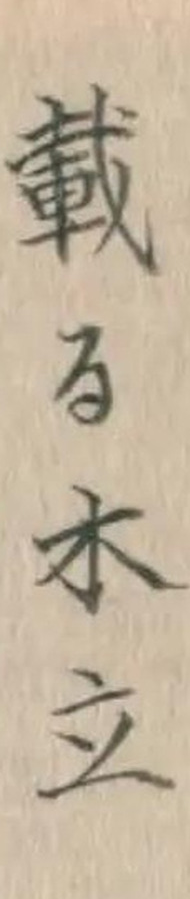載る木立

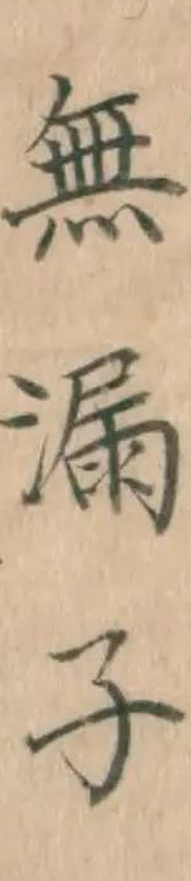無漏子
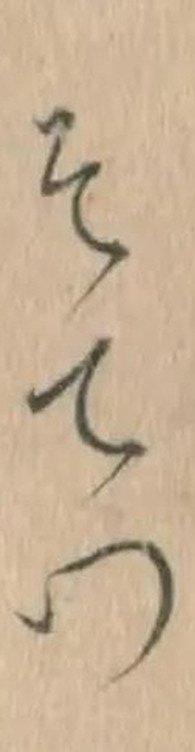そてつ
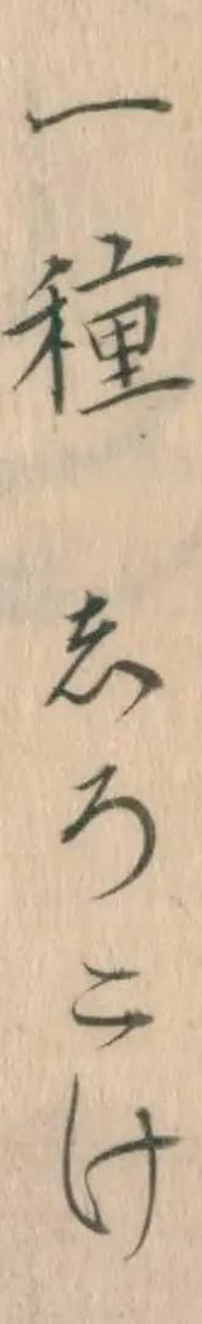一種しろこけ

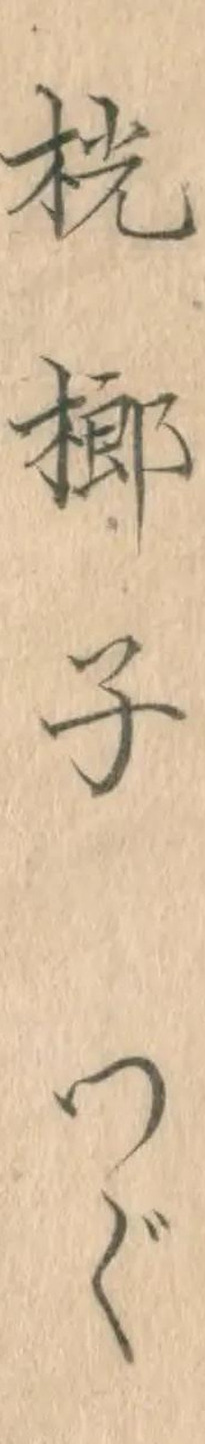桄榔子つぐ

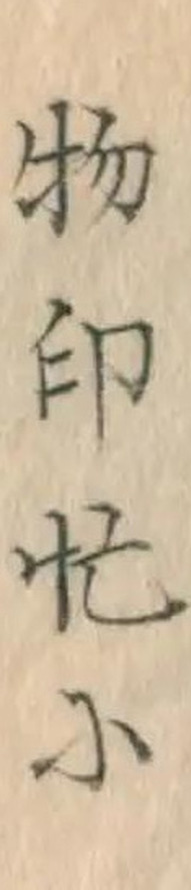物印忙に
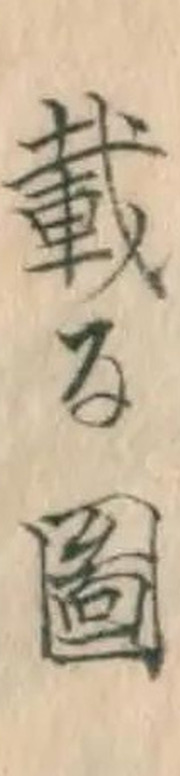載る図

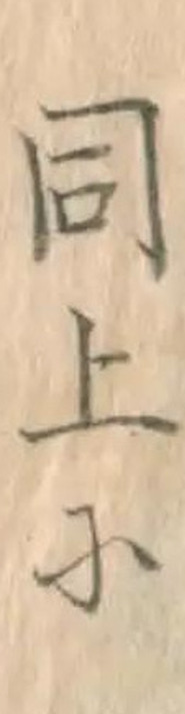同上に
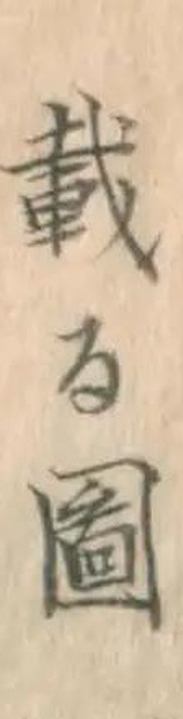載る図

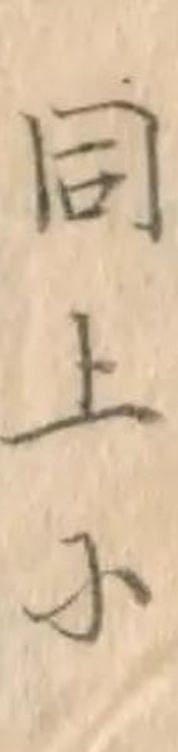同上に
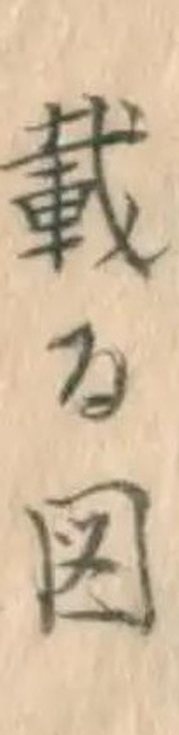載る図

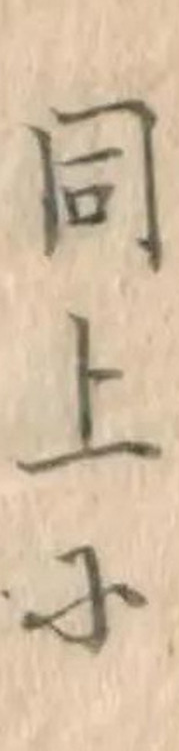同上に
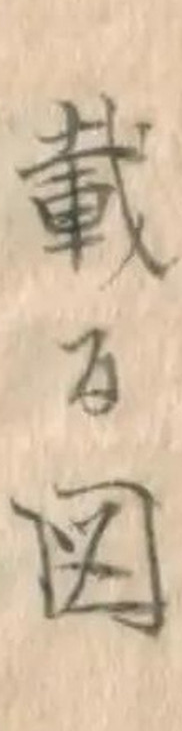載る図

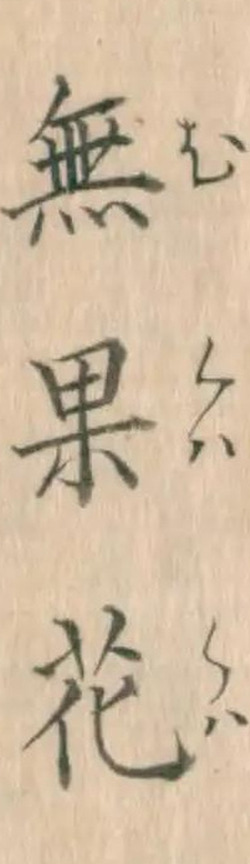無果花

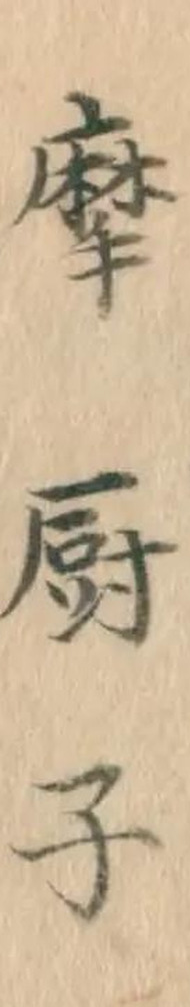摩厨子

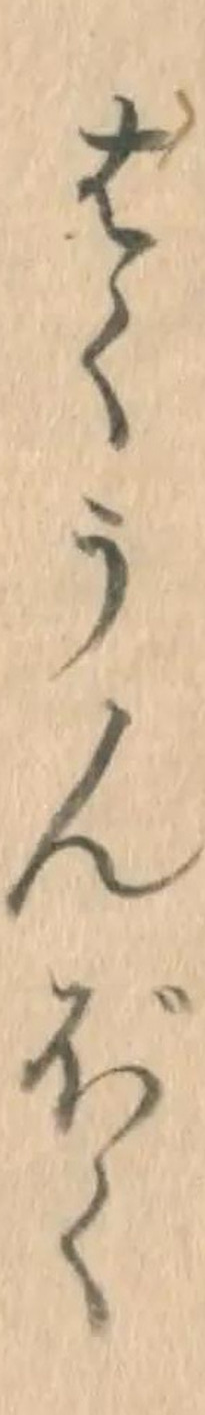はくうんぼく
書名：本草図譜. 巻67-69
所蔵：国立国会図書館 National Diet Library, JAPAN
